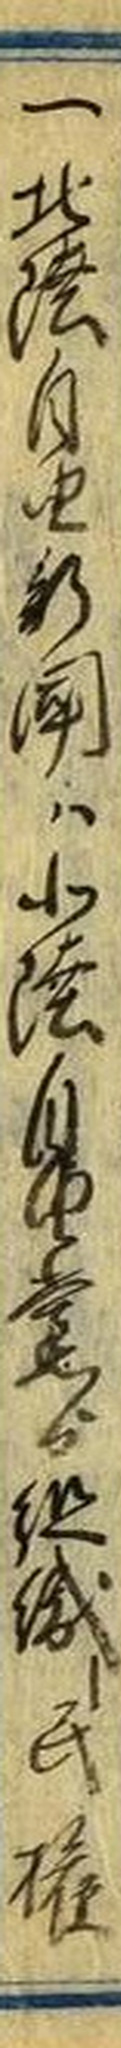一北陸自由新聞は北陸自由党ゟ組織し民権
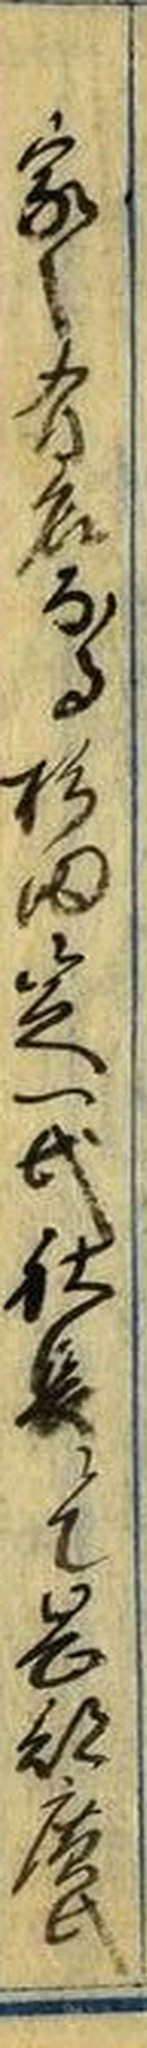家之有名なる杉田定一氏社長にて岡部広氏
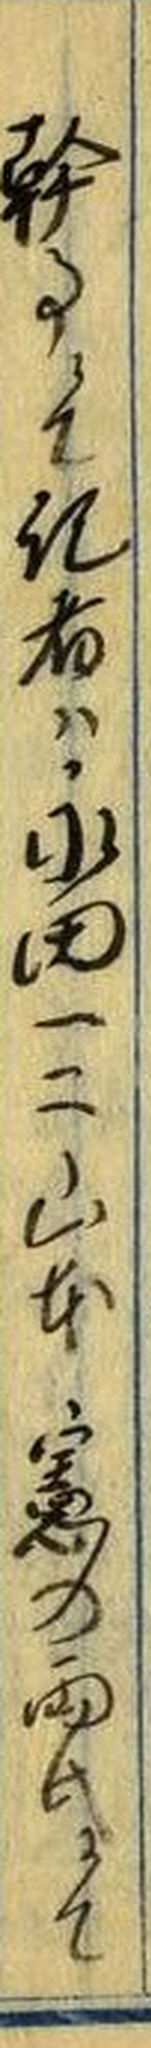幹事にて記者は永田一二山本憲の両氏にて
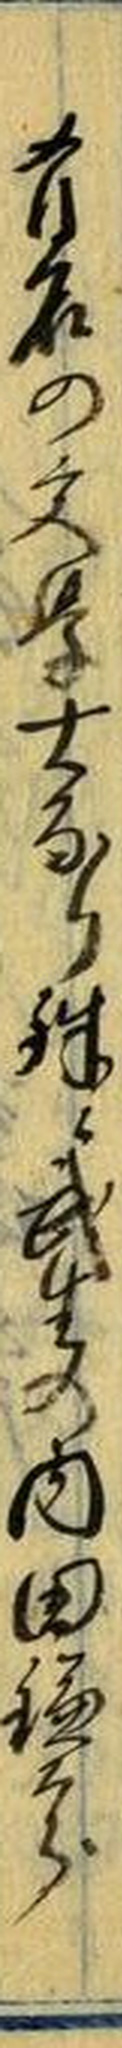有名の文学士なり殊に武生の内田謙太郎
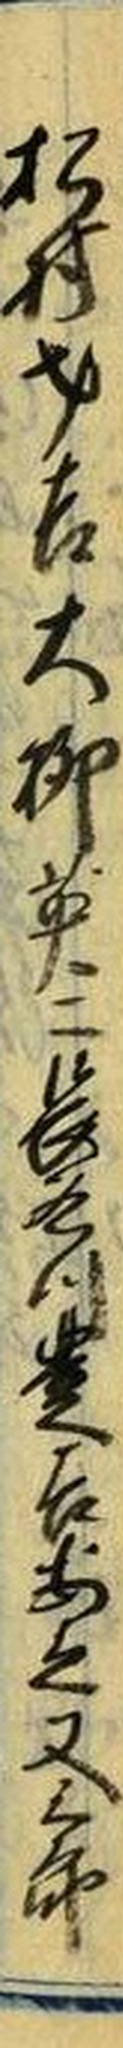松村才吉大柳英二長谷川豊吉安立又三郎
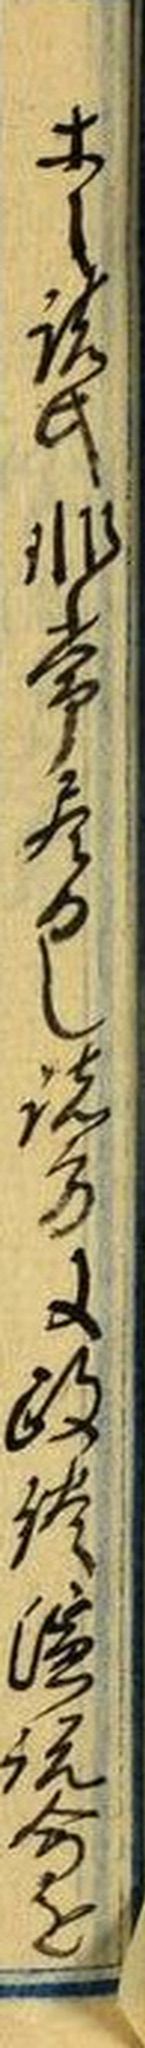等之諸氏非常尽力し諸方に政談演説会を
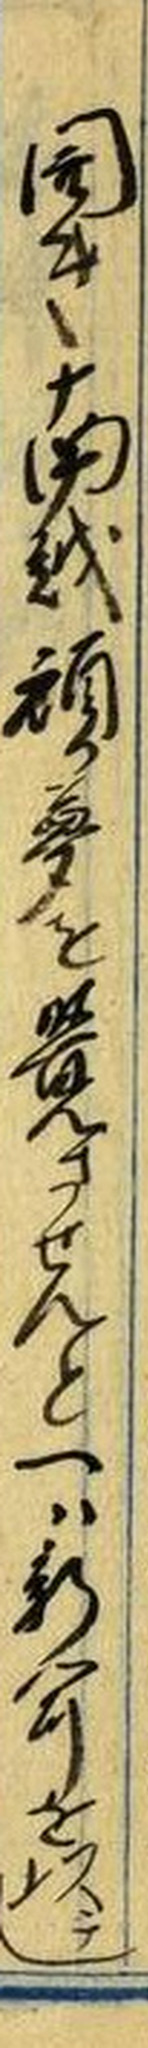開き南越頑夢を覚させんと一は新聞を以てし
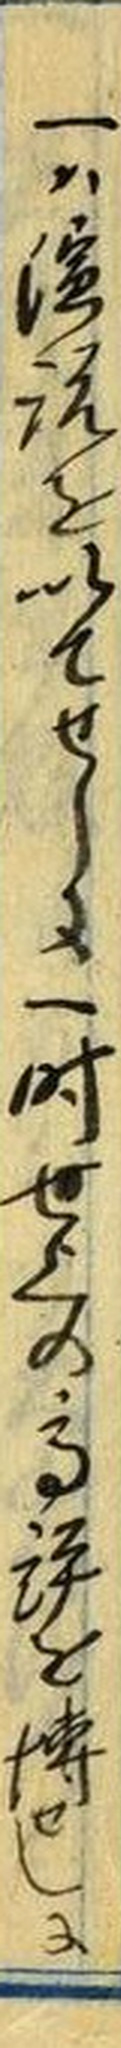一は演説を以てせし又一時世上の高評を博せしに
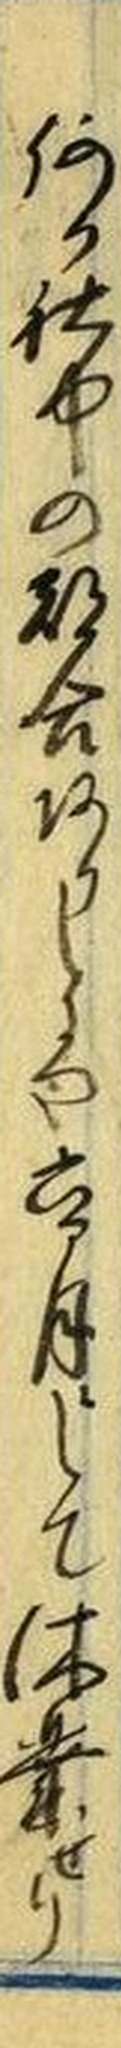何か社中の都合ありしにや六月にして休業せり

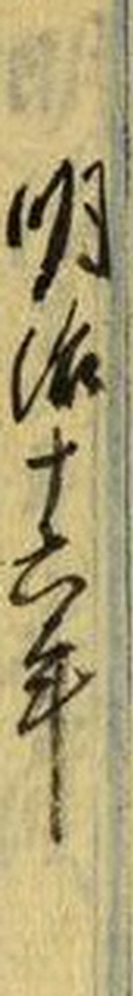明治十六年
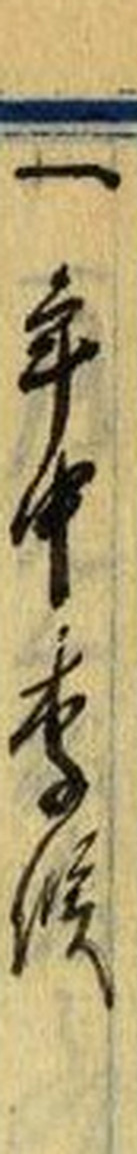一年中季候
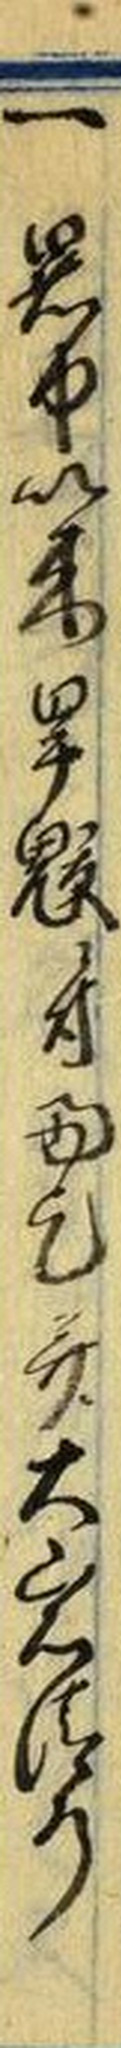一暑中以来旱魃に付雨乞并大岩清水
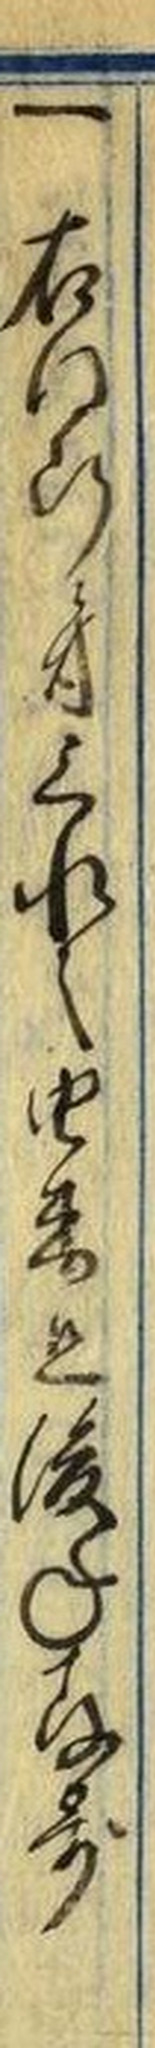一右同断に付上水之由来且後年存寄
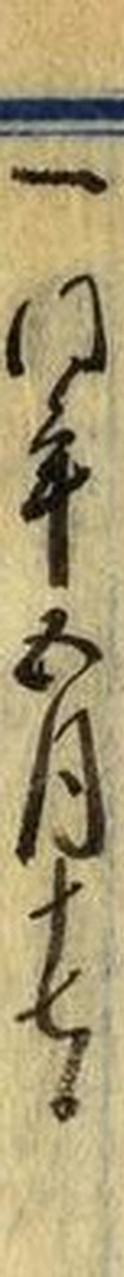一同年五月十七日
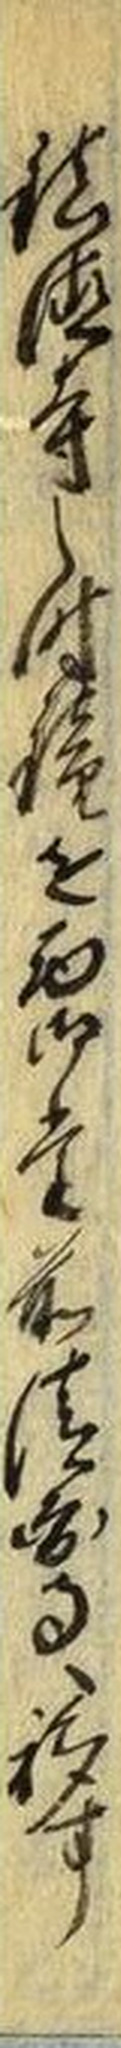鎮徳寺之時鐘を西御堂前清円寺へ移す
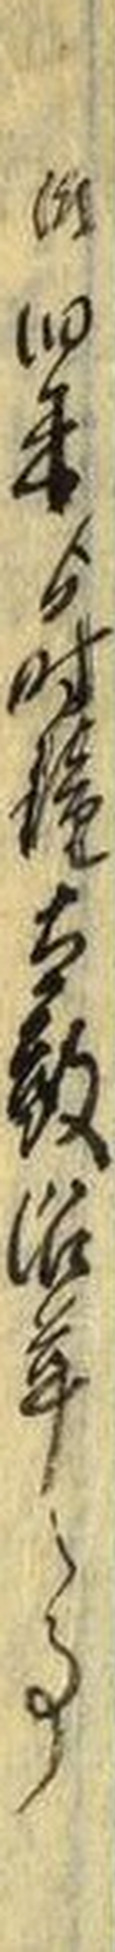附旧来ゟ時鐘太鼓沿革之事
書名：温古集 五巻
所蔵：福井県文書館 Fukui Prefectural Archives
